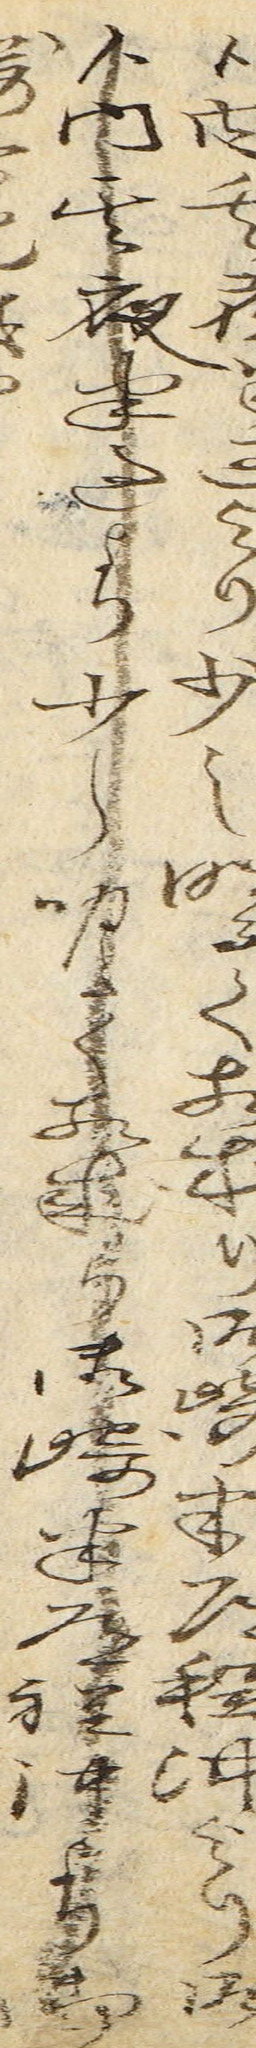候内其夜半過より少し明るく相成り御崎半道程沖より御

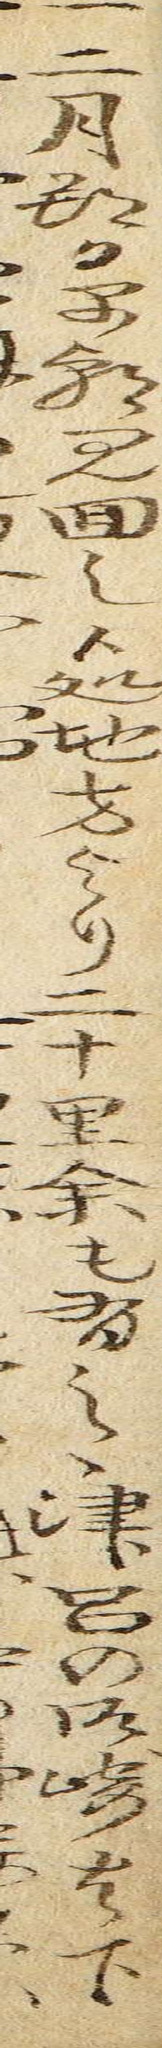一二月朔日早朝見回し候処地方より二十里余も有之候津呂の御崎者下
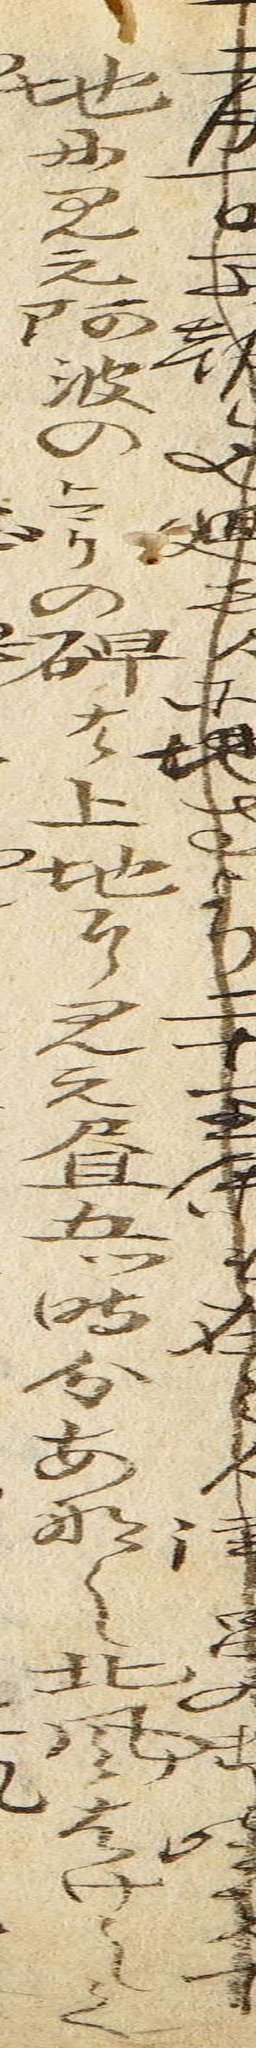地に見え阿波のトマリの碑者上地に見え昼五ツ時分あなし北風はけしく
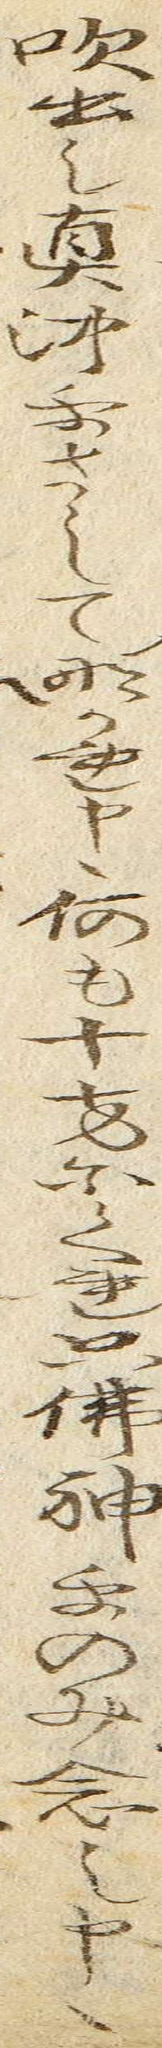吹出し真沖をさしてなかれ申候何も十方にくれ只仏神をのみ念し申候
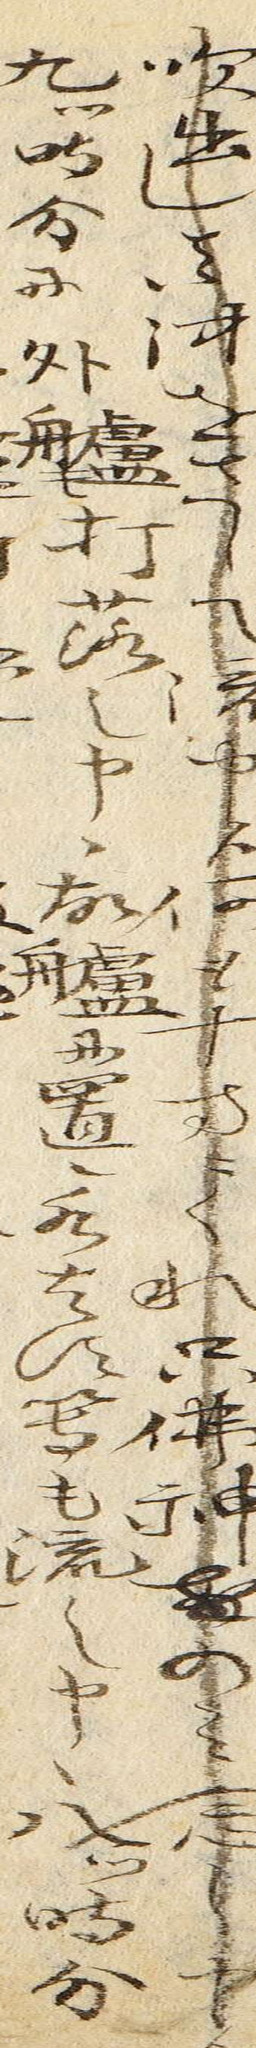九ツ時分に外艫打落し申候故艫に置候水はす等も流し申候八ツ時分
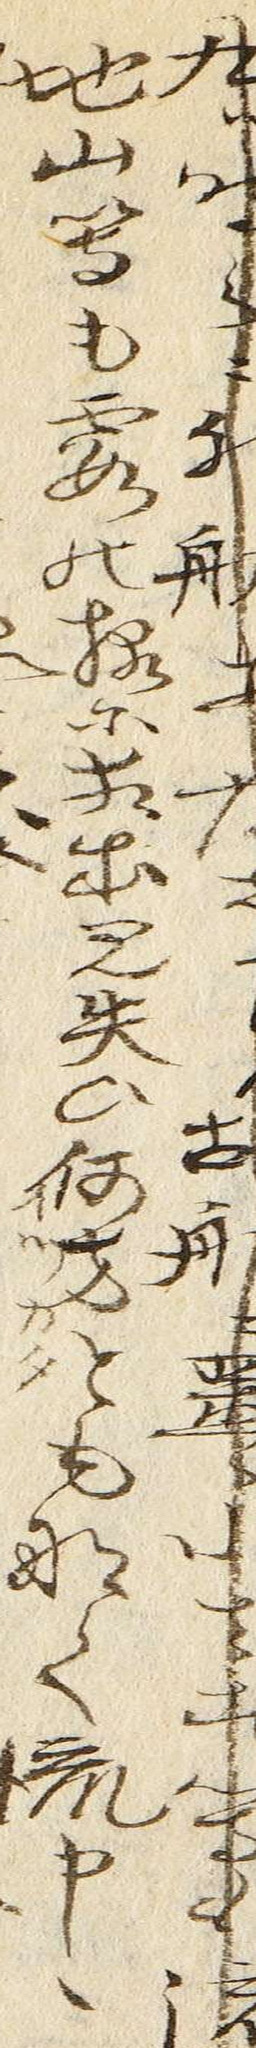地山等も霞の様に相成見失ひ何方ともなく流申候
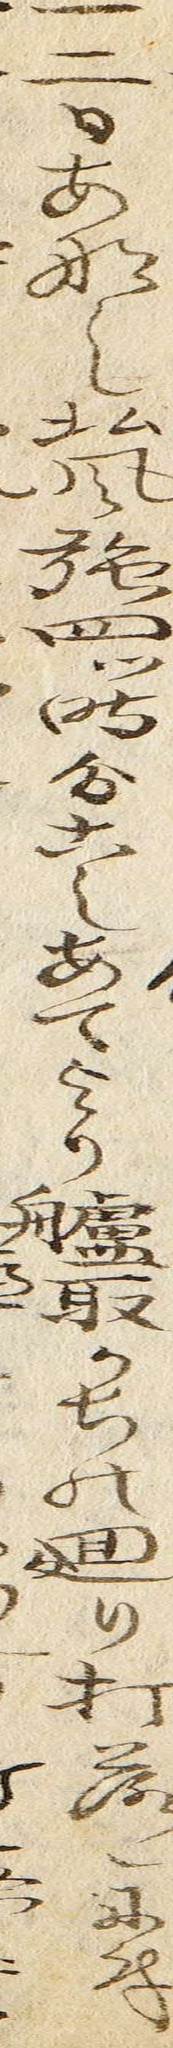一二日あなし北風強四ツ時分こしあてより艫取かちの廻り打落候に付
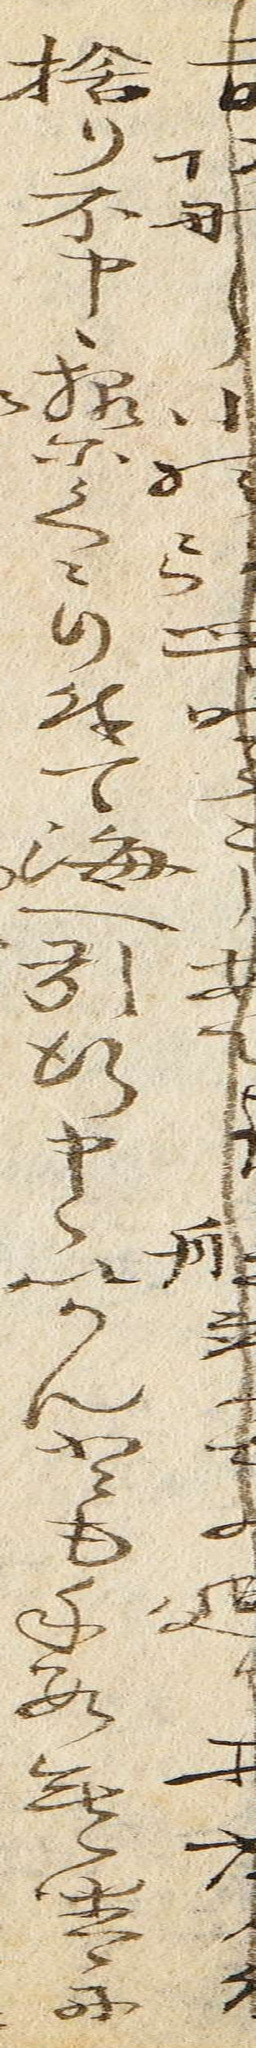捨り不申候様にくゝり付て海へ引行申候いかんとも手段無御座候に
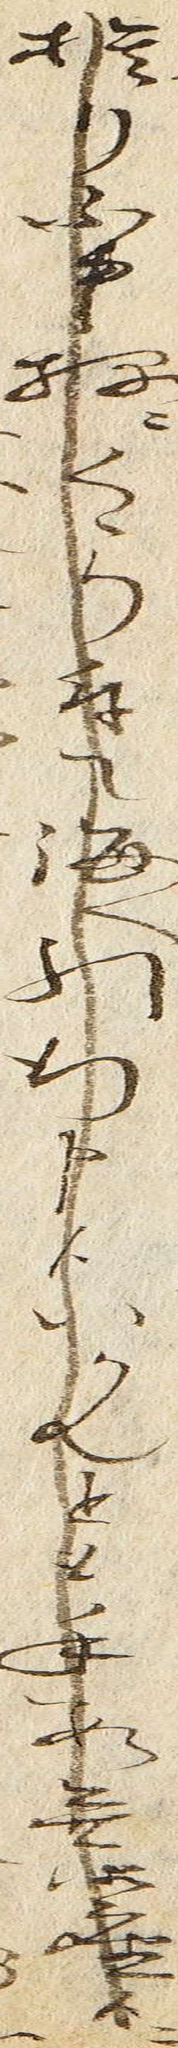捨り不申候様にくゝり付て海へ引行申候いかんとも手段無御座候に
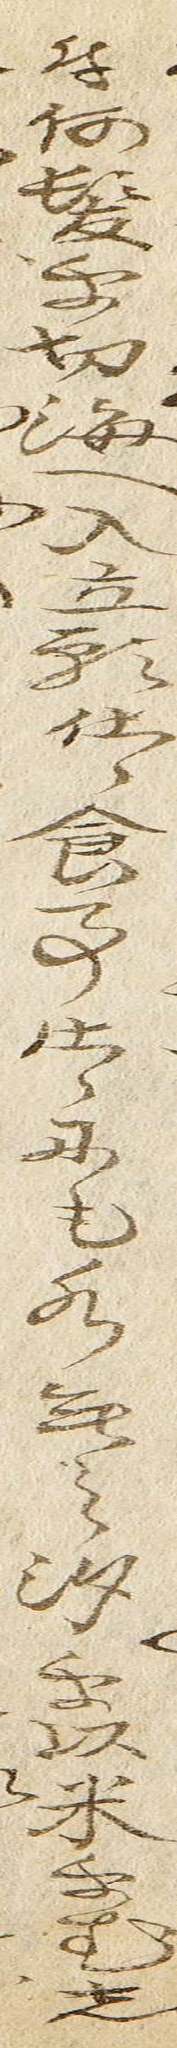付何髪を切海へ入立願仕候食事仕候にも水無之汐を以米をむし
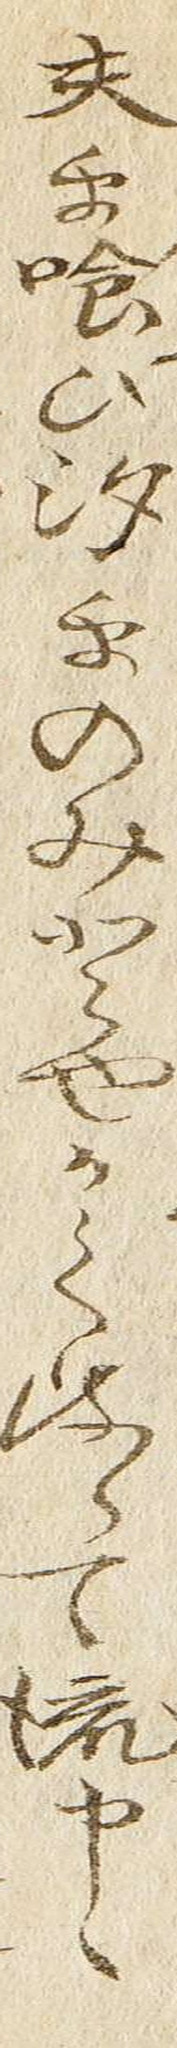夫を喰ひ汐をのみとやかく致候て流申候
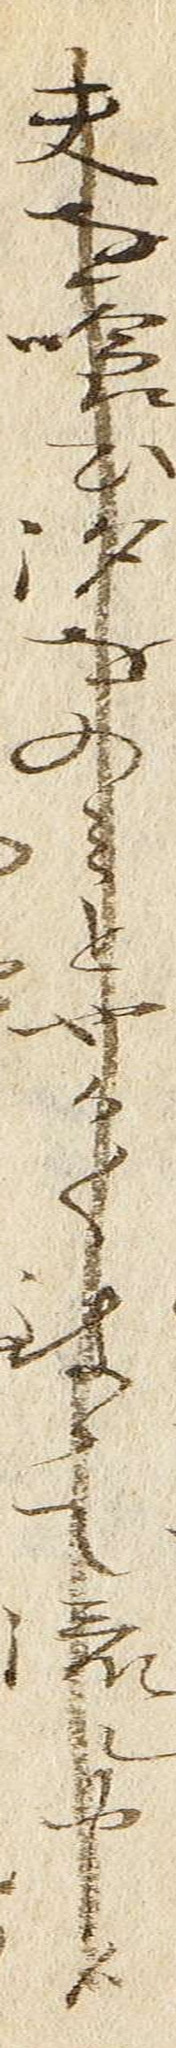夫を喰ひ汐をのみとやかく致候て流申候
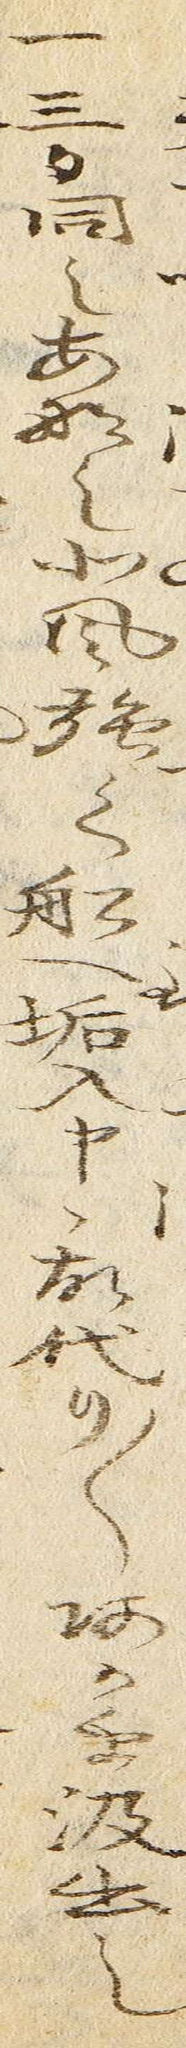一三日同しあなし北風強く船へ垢入申候故代り〳〵あかを汲出し
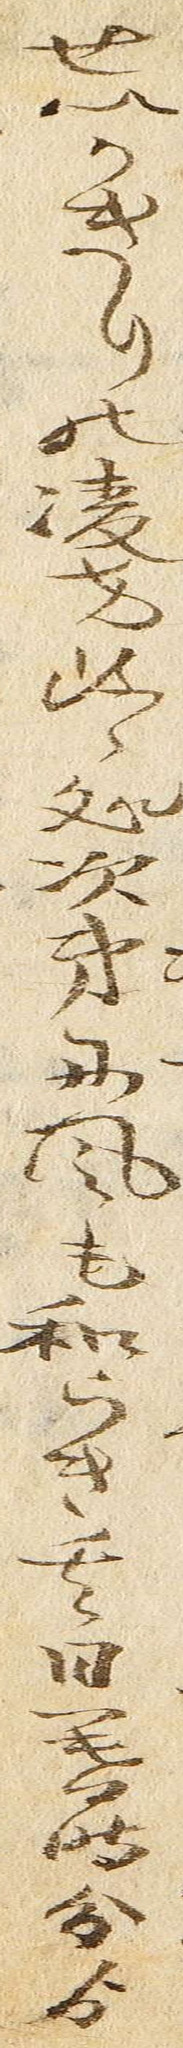せいかきりの凌方致候処次第に風も和らき其日暮時分ゟ
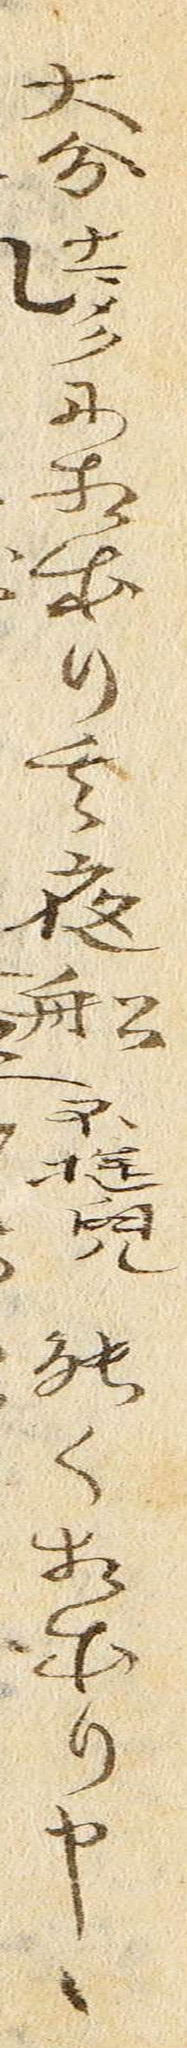大分凪に相成り其夜船不児身持能く相成り申候
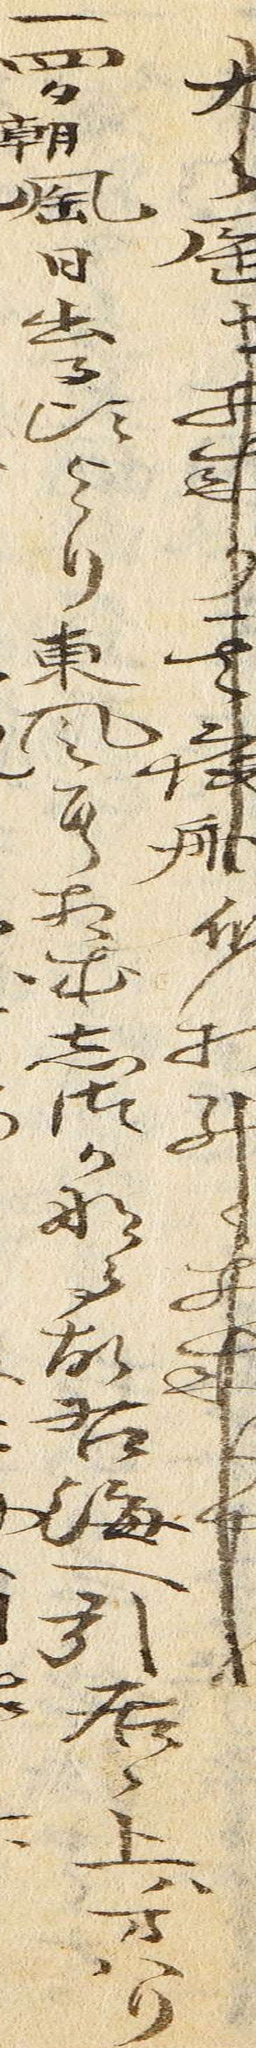一四日朝凪日出る頃より東風に相成しつかなる故右海へ引居候上ハまハり
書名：無人島漂流書付
